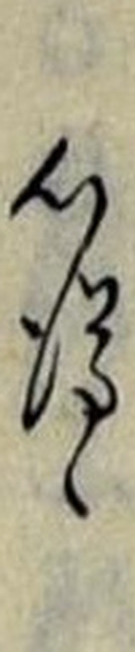心得候
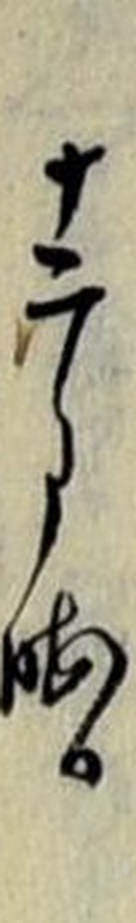十二月晦日
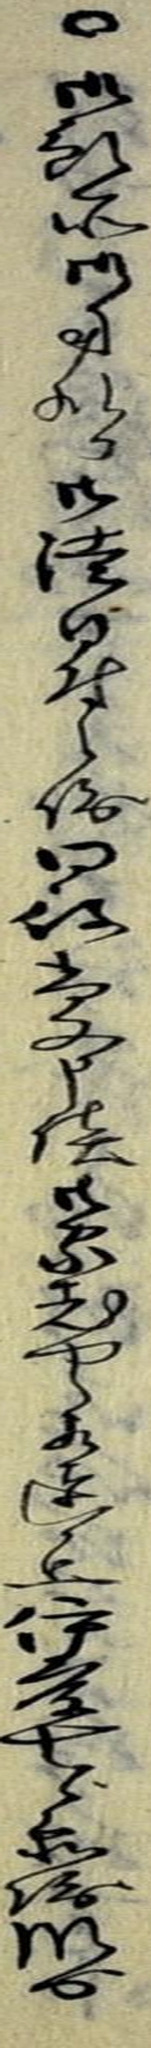〇御預所御用掛り御徒目付之儀同役尚又申談御家老中へ相達候上伊藤七郎兵衛儀段右衛門
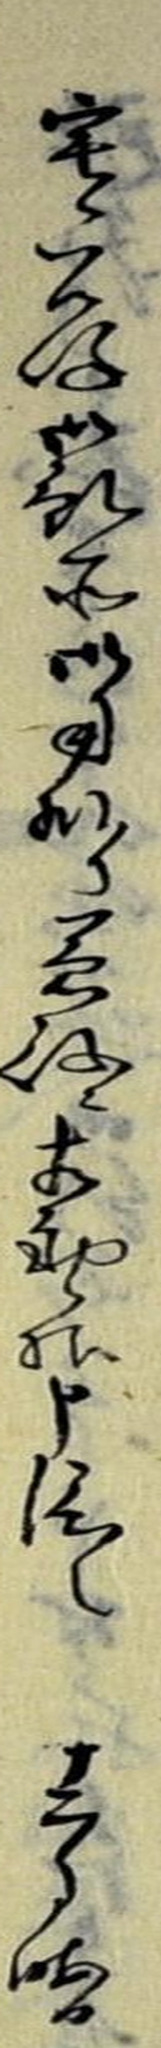宅へ召呼御預所御用掛り兼役に相勤候様申渡之十二月晦日
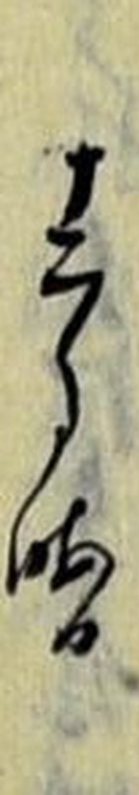十二月晦日
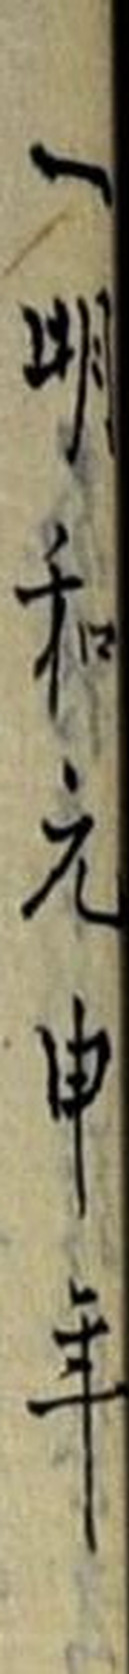一明和元申年
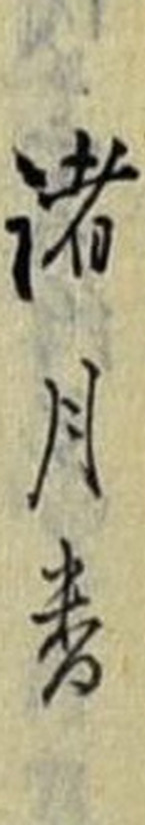諸月番
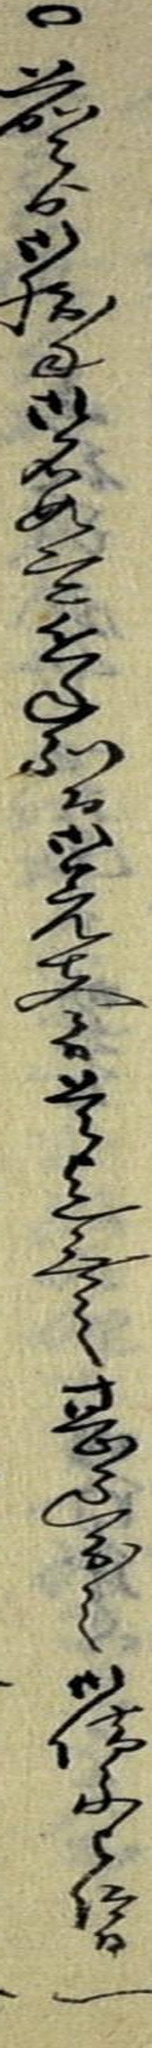〇前々ゟ御勝手御不如意近年別而御差支に付是迄無之甚過分之御借米被仰付一
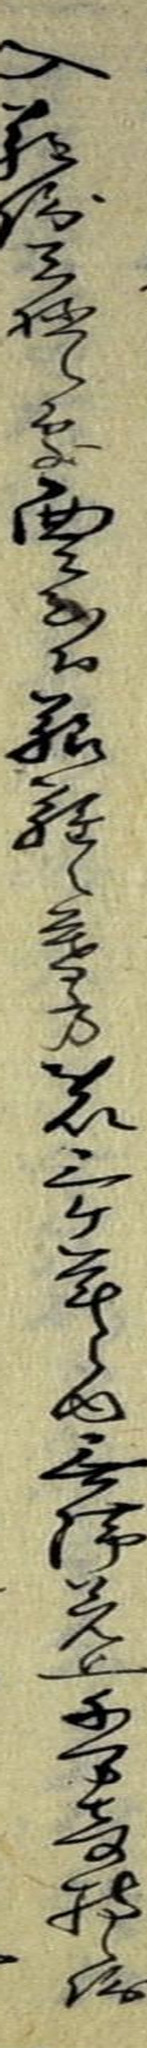入難儀至極之処面々至而艱難之暮方を以三ヶ年之内無滞差上千万奇特之儀
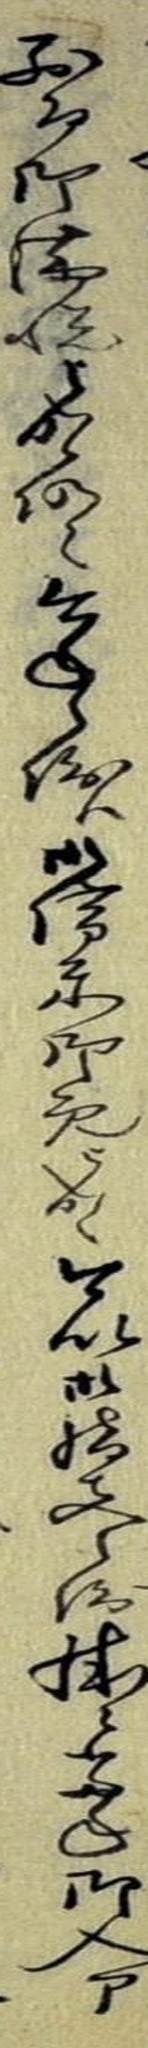別而御満悦被成仍之今年之儀は御借米御免被成候今以御指支之儀誠に当年御入部
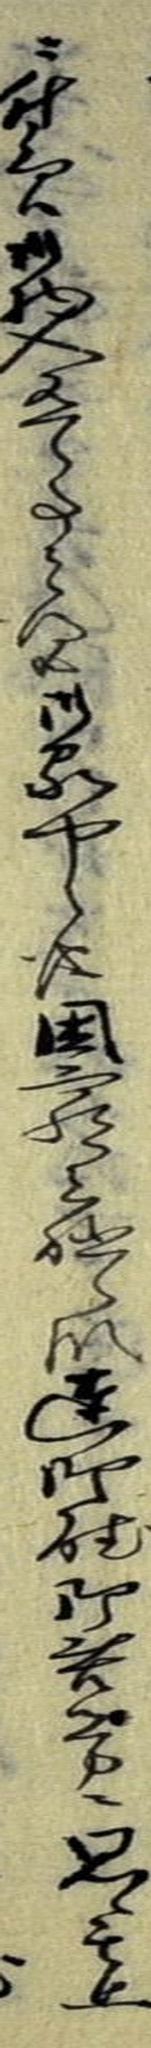に付而は御物入有之事に候得共御家中之儀困窮至極之段達御聴御苦労に思候其上
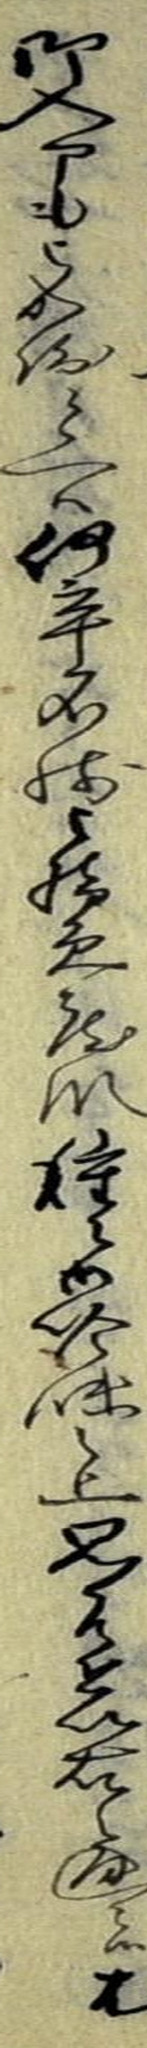御入部も被成儀に候へは何卒不残被指免度段種々御吟味之上思召を以右之通に候尤
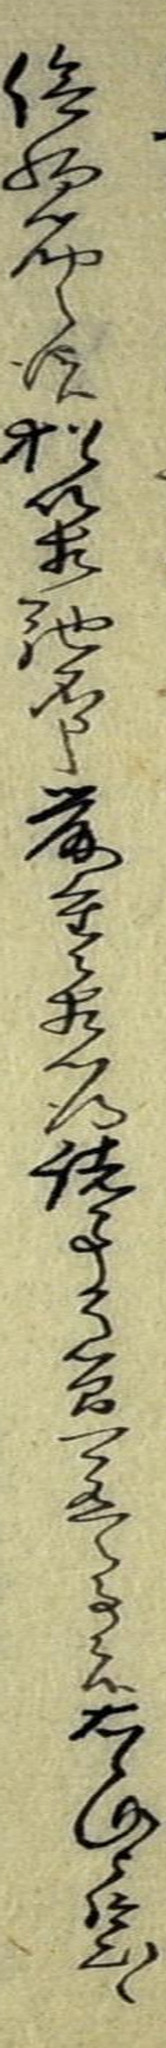倹約筋之儀は猶以相弛不申厳重に相心得諸事了簡可有之事に候右之趣被仰出候
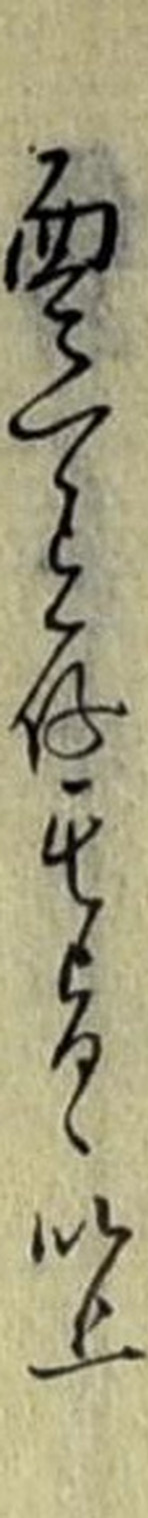面々可被存其旨候以上
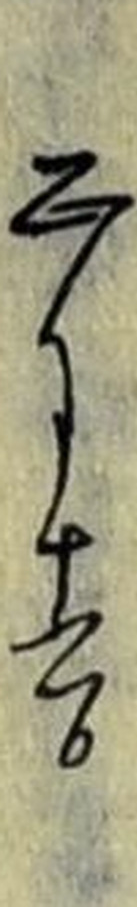正月十六日
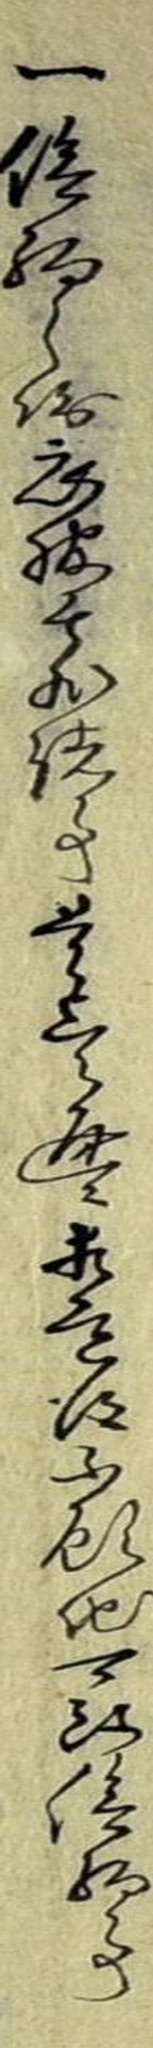一倹約之儀衣服其外諸事是迄之通に相意得不顧他可致倹約事
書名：命令之部 二
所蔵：福井県文書館 Fukui Prefectural Archives
